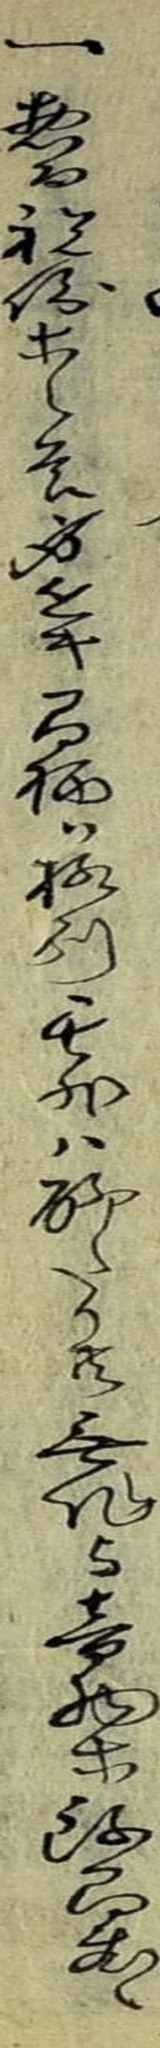一惣而祝儀等之節身近キ間柄ハ格別其外ハ聊たり共無作与音物等致間敷候
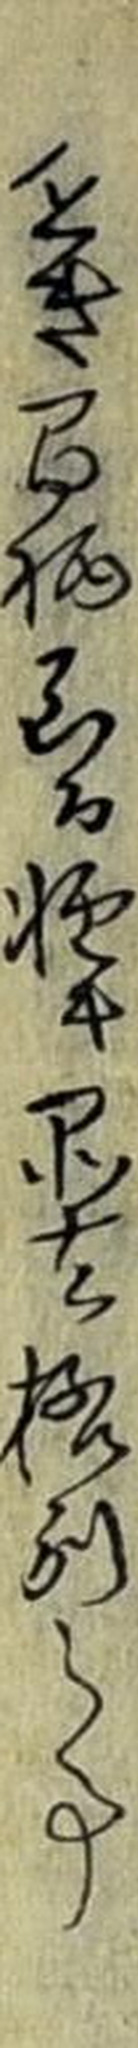近き間柄至而軽キ品者格別之事
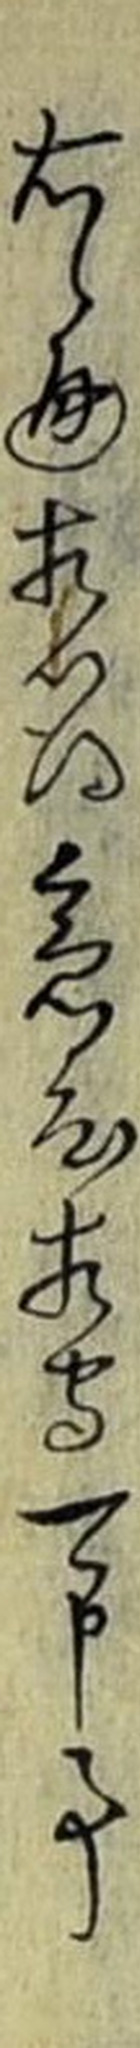右之通相心得急度相守可申事
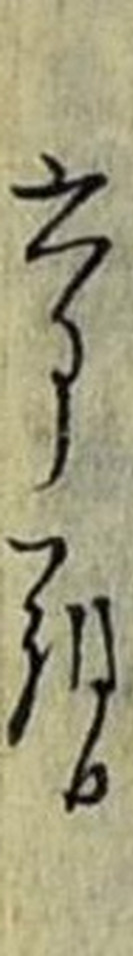六月朔日
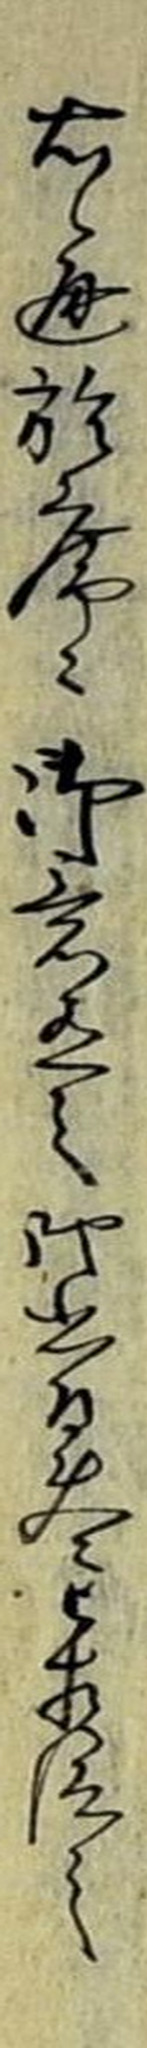右之通於席々御意有之御書付夫々被相渡之
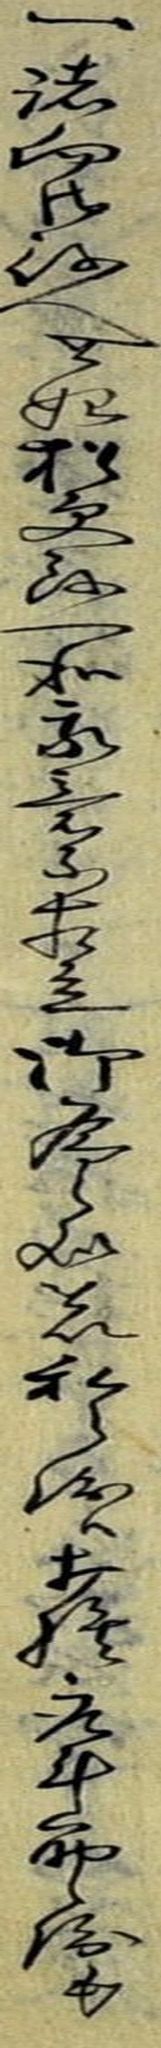一諸向御役人を始猶更致一和我意等相立御為之処を以私之儀ハ打捨取計筋之儀も
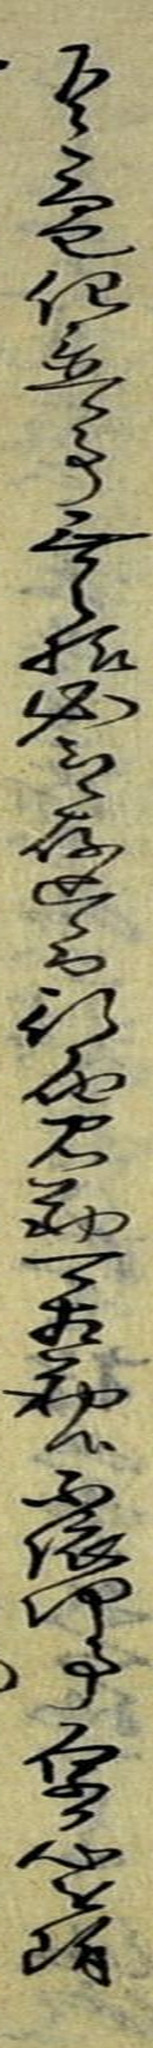下々へ而已任置候事無之様必至ニ存込候而行届忠勤可相勤候不依何事厚ク心を付
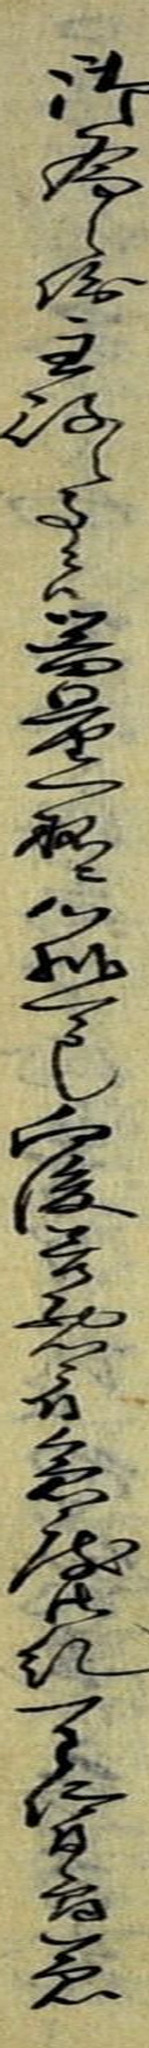御為之儀主役之事ニハ器量一杯ニ心掛可申候向後善悪ニ付急度御糺可被仰付候間兼
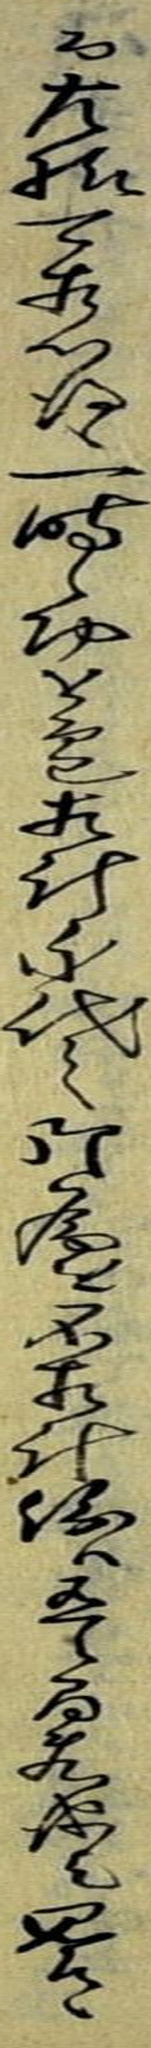而左様可相心得候一時之功を而已相計永代之御為を不相計儀ハ有之間敷儀与思召候
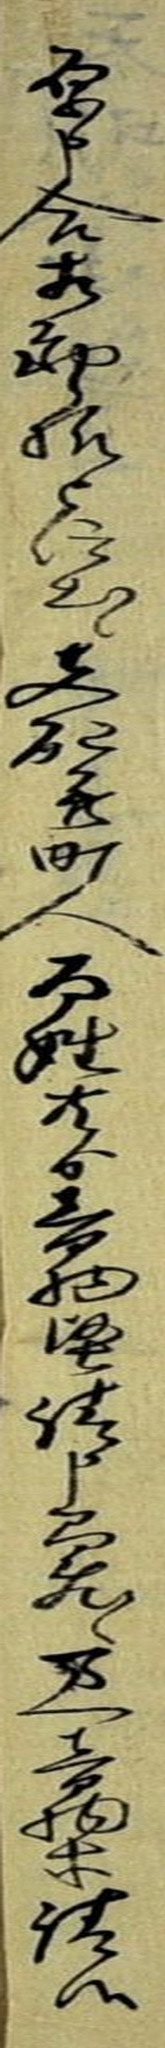厚申合相勤候様被仰出候支配并町人百姓共ゟ音物堅請申間敷候万一音物等請候
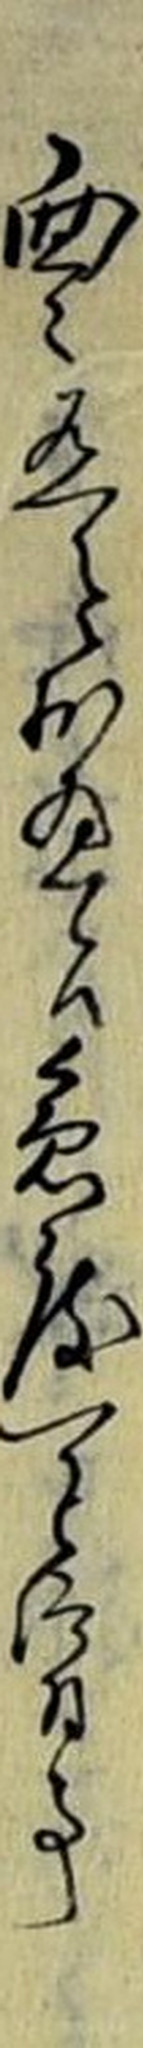面々有之ニおゐてハ急度可被仰付事
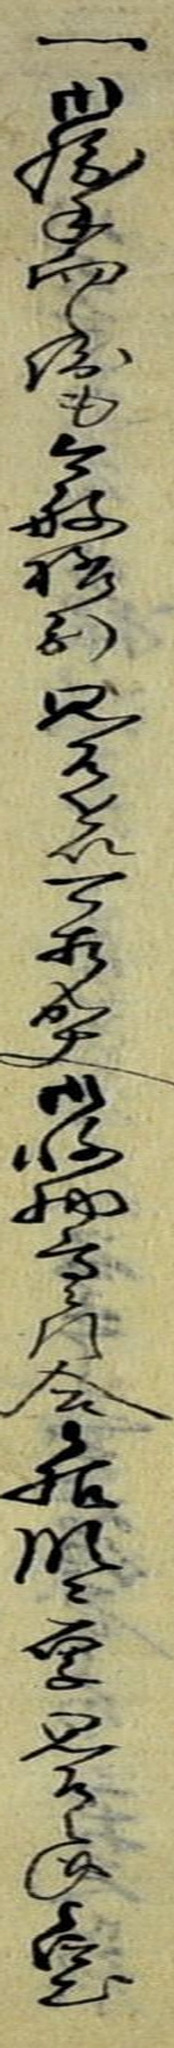一御勝手向之儀も今般格別思召を以可相成丈御収納高ニ引合候様段々厚思召之趣被仰出
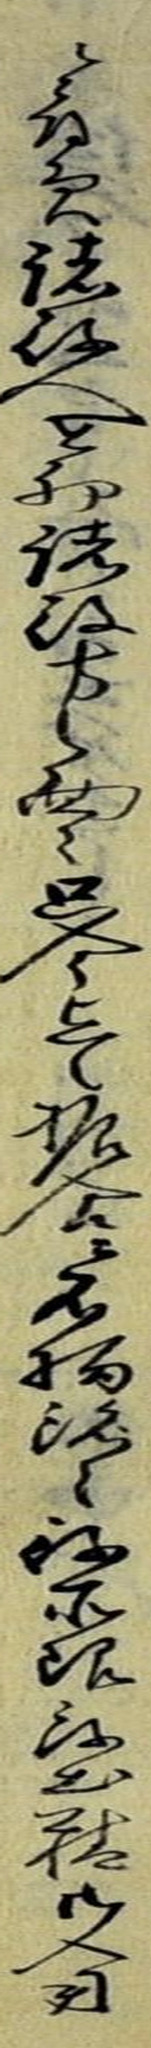候ニ付而ハ諸役人を初諸役方之面々只今迄之振合ニ不拘銘々役所限致出精御入用
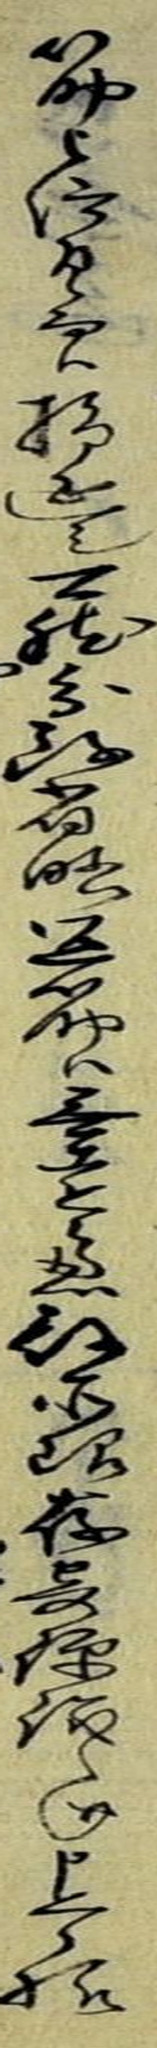筋被仰付候而ハ指延シ可然分致省略宜筋ハ無遠慮役所限存寄評議之趣申上候様
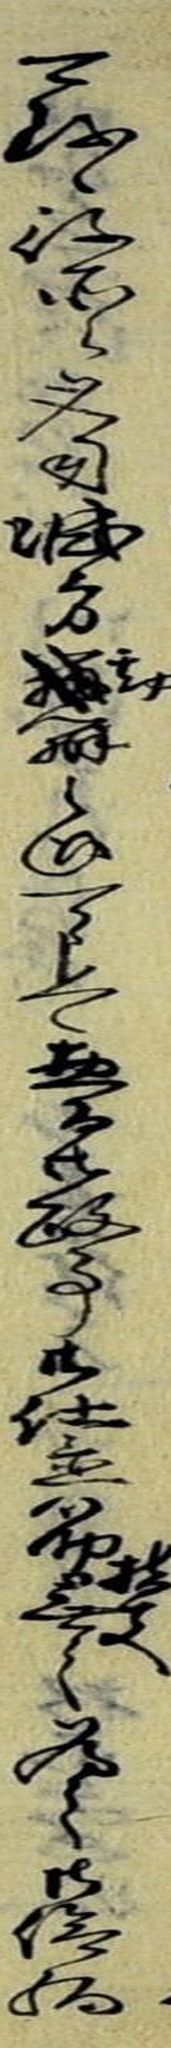可致候役所之必用減方勘弁之趣可申上候惣而此政事御仕置筋指支無之為之御倹約
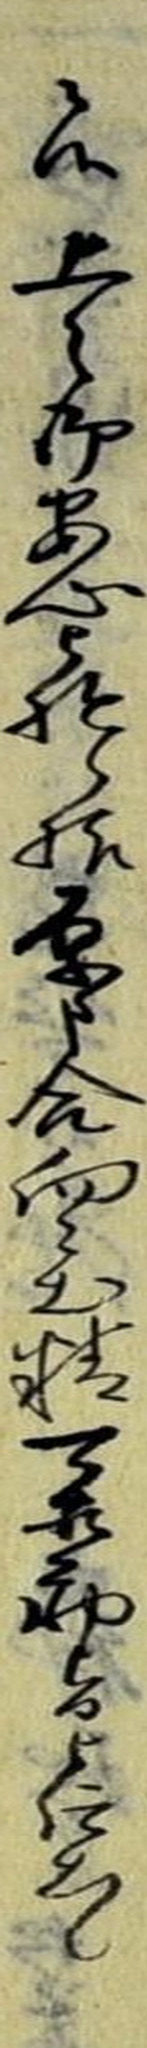ニ候上之御安心被遊候様厚申合向々出精可相勤旨被仰出候
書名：命令之部 三
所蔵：福井県文書館 Fukui Prefectural Archives
